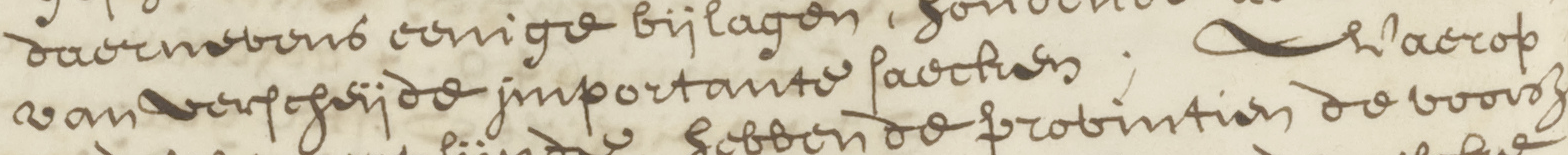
van verscheijde importante saecken. Waerop
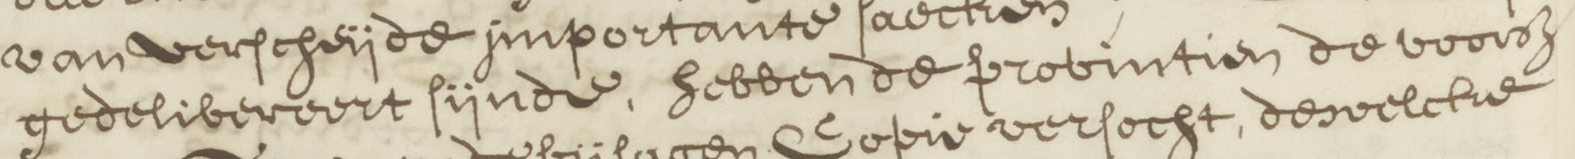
gedelibereert sijnde, hebben de provintien de voorsz
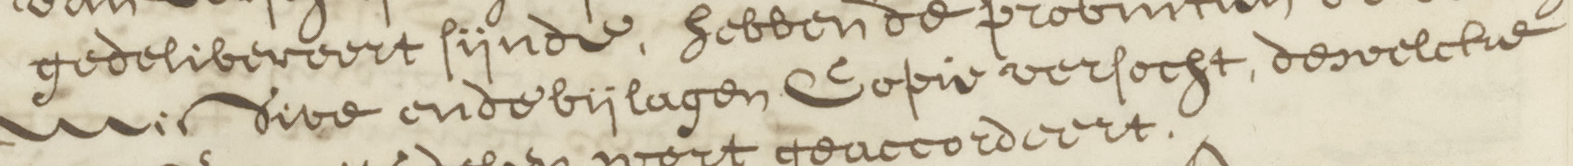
Missive ende bijlagen Copie versocht dewelcke
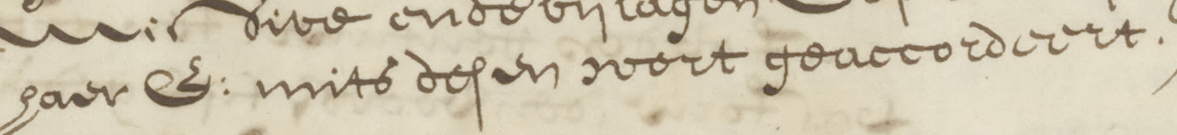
haer E. mits desen wort geaccordeert.
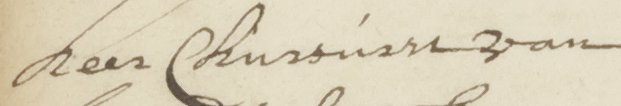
heer Churfurst van
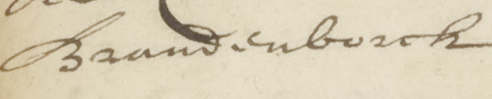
Brandenborch
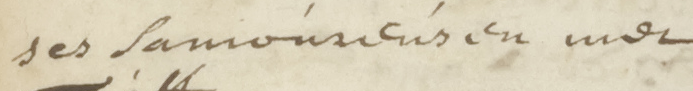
ses Samoureusen met
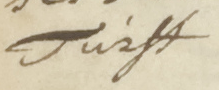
Turff
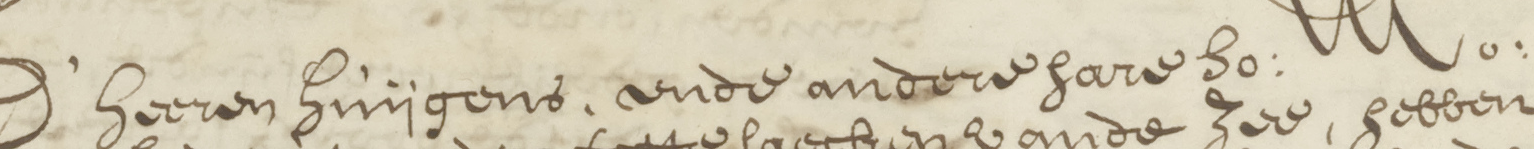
D'heeren Huijgens, ende andere hare ho:Mo:
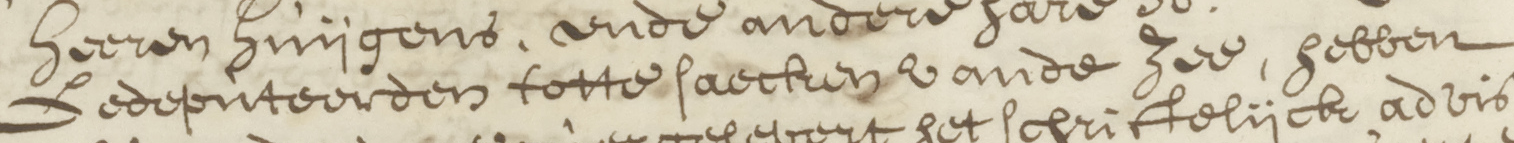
Gedeputeerden totte saecken vande Zee, hebben
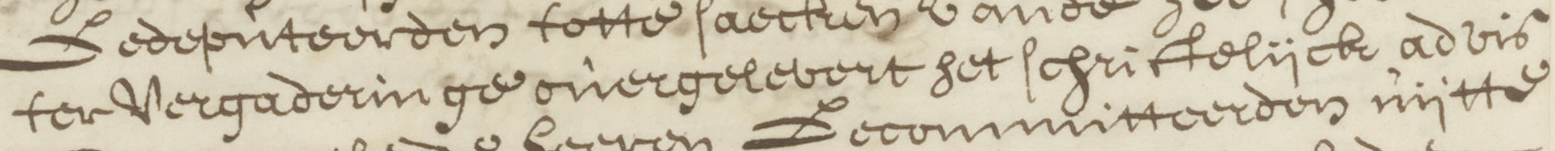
ter Vergaderinge ouergelevert het schriftelijck advis
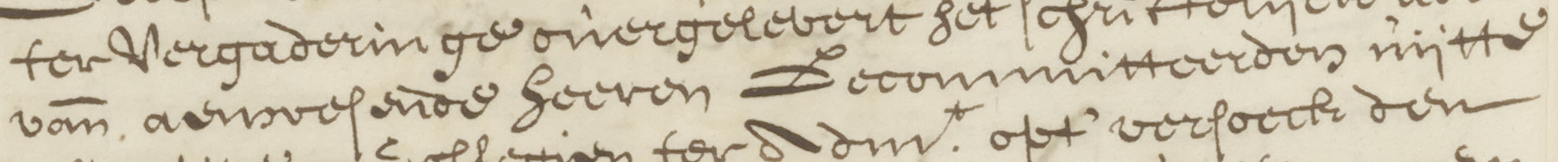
van aenwesende heeren Gecommitteerden uijtte
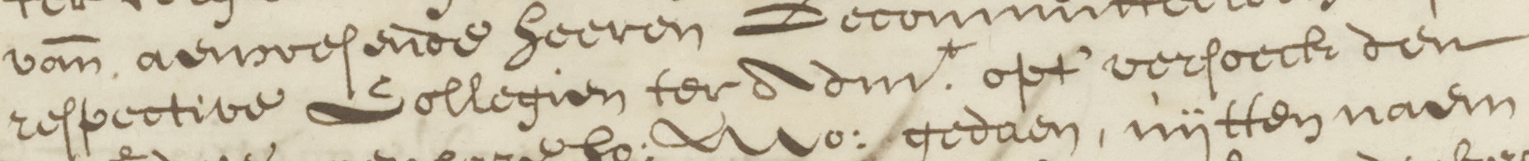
respective Collegien ter Admt. opt' versoeck den
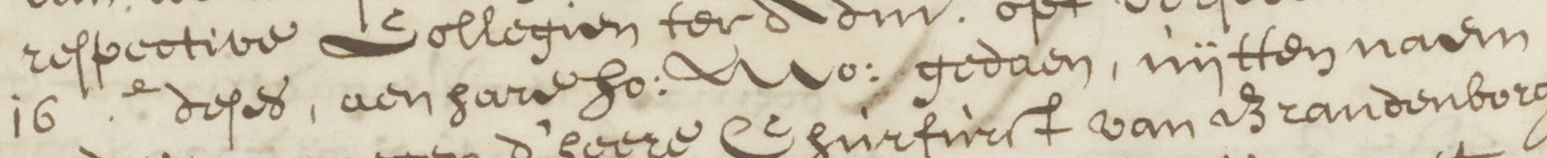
16.e deses, aen hare ho:Mo: gedaen, uijtten naem
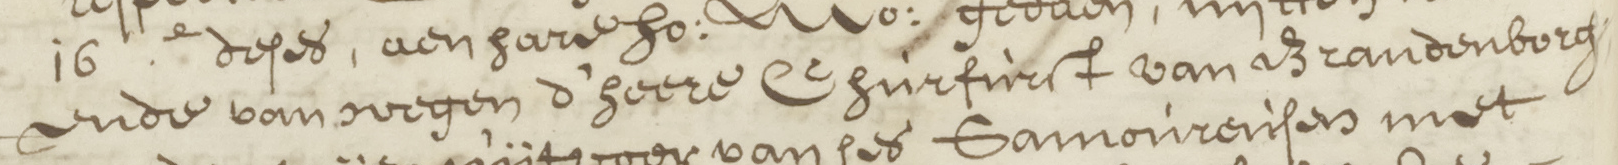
ende van wegen d'heere Churfurst van Brandenborg
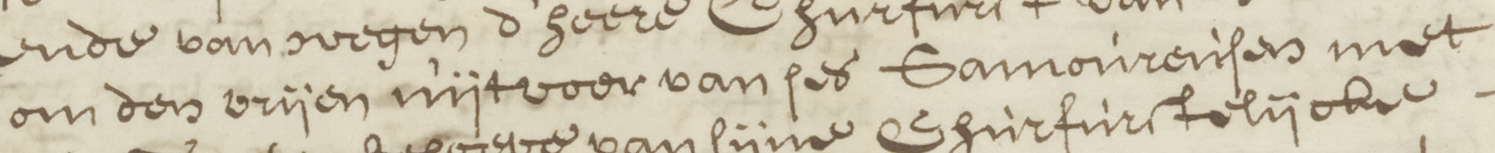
om den vrijen uijtvoer van ses Samoureusen met
